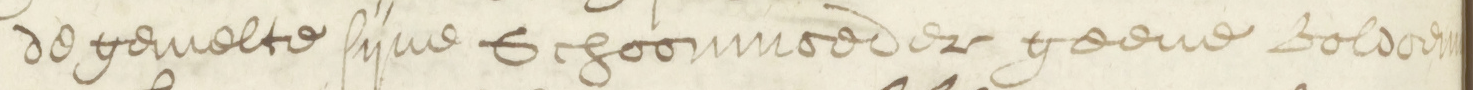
de gemelte sijne Schoonmoeder geene voldoen
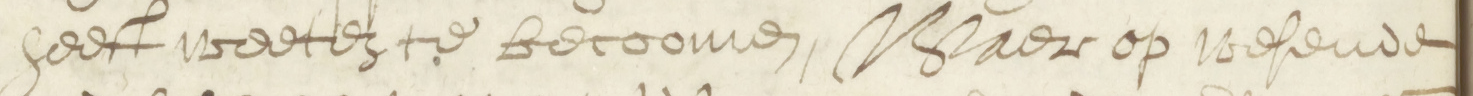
heeft weeten te becoomen. Waer op wesende
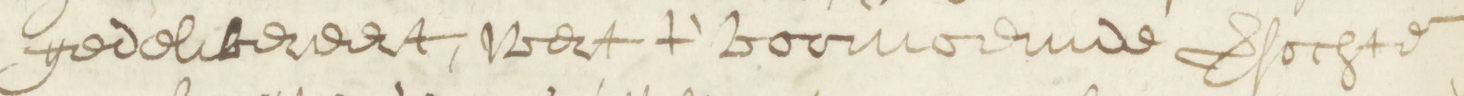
gedelibereert, wert t'voornoemde vsochte
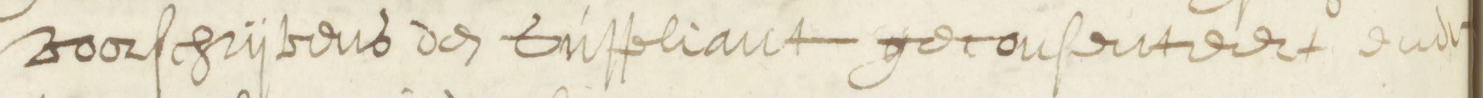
voorschrijvens den suppliant geconsenteert ende
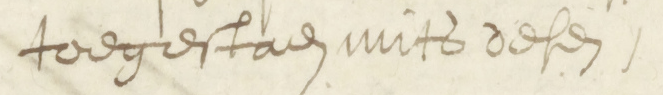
toegestaen mits desen.
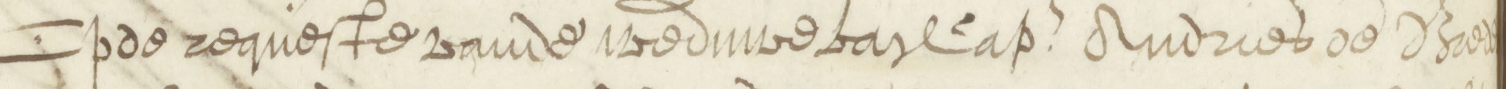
Opde requeste vande weduwe van Capn. Andries de Bres
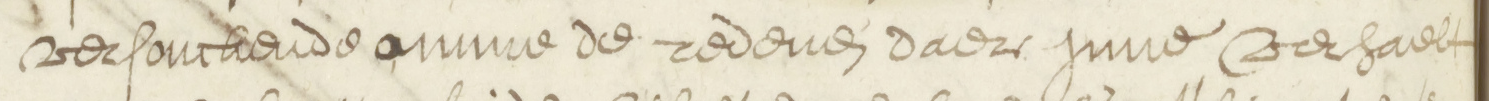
versouckende omme de redenen daer Inne verhaelt
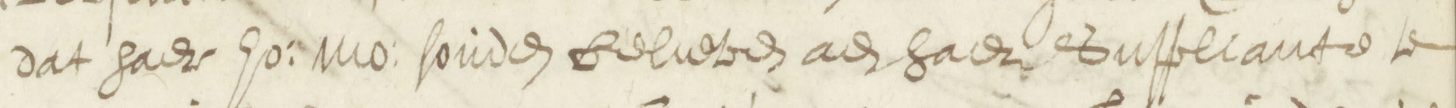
dat haer ho:mo: souden believen aen haer Suppliante te
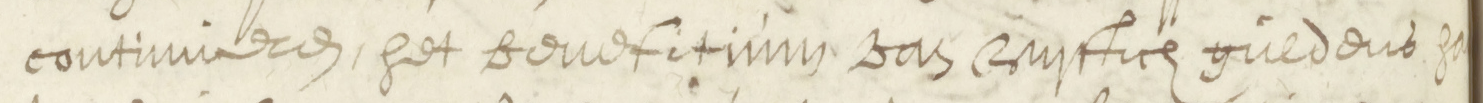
continueren, het benefitium van vijftich guldens ha
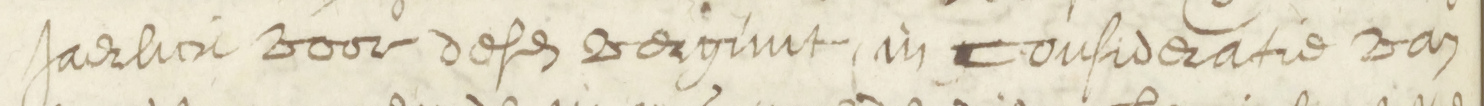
Jaerlicx voor desen vergunt, in consideratie van
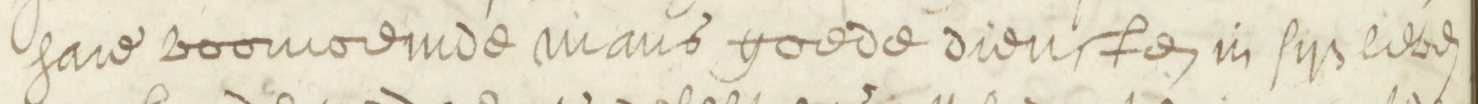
hare voornoemde mans goede diensten in sijn leven
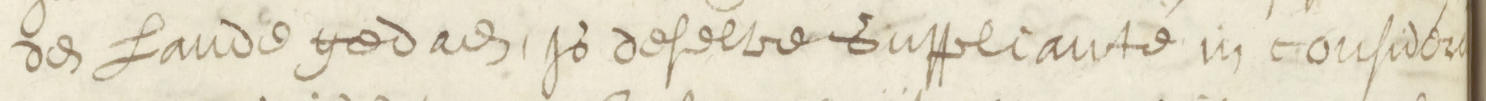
den Lande gedaen, Is deselve Suppliante in considera
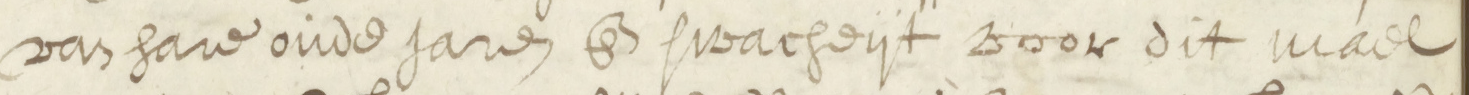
van hare oude jaren & swacheijt voor dit mael
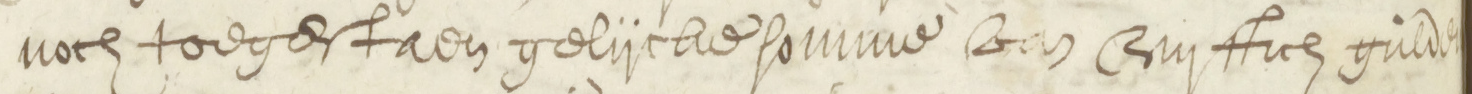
noch toegestaen gelijcke somme van vijfftich gulden
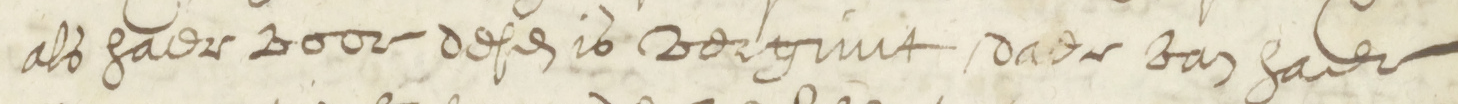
als haer voor desen is vergunt, daer van haer
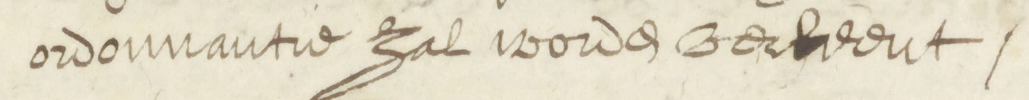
ordonnantie zal worden verleent.
